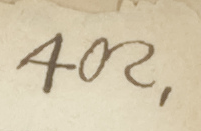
482.
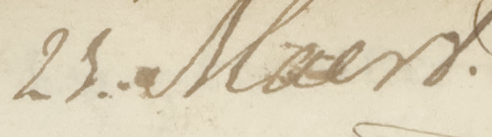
21. Maert.
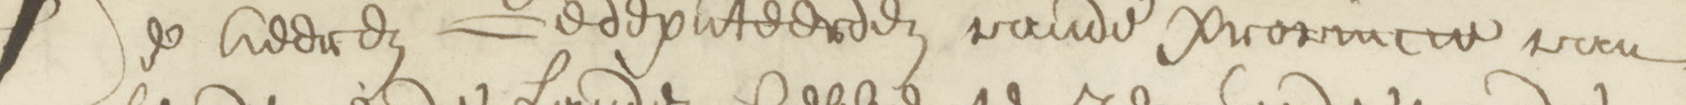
De heeren Gedeputeerden vande Provincie van
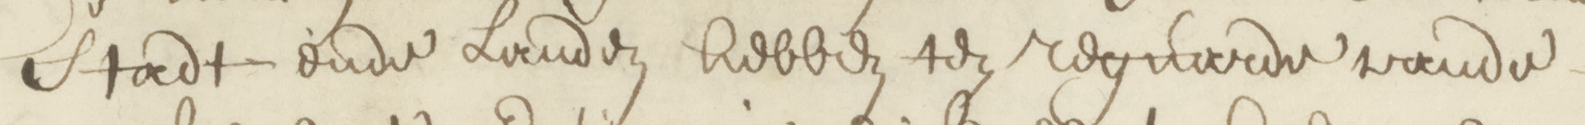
Stadt ende Landen hebben ten reguarde vande
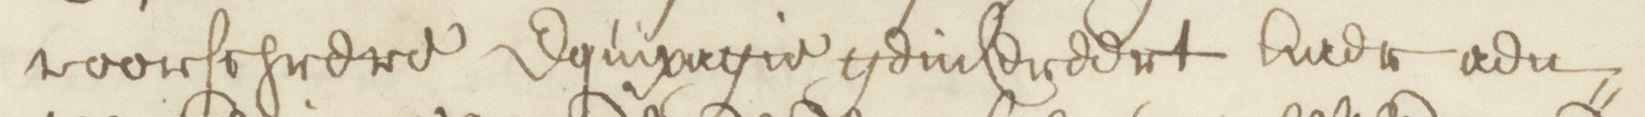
voorschreve Equipagie geinhereert haer aen„
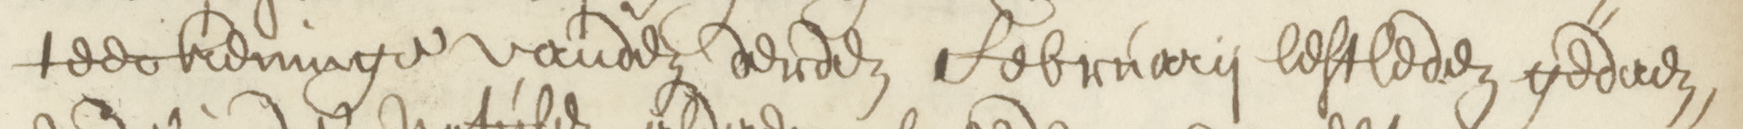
teeckeninge vande derden februarij lestleden gedaen.
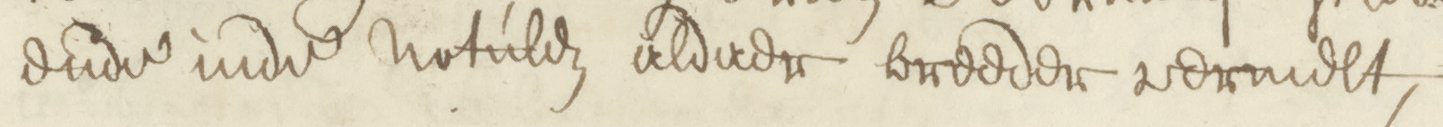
ende inde notulen aldaer breeder vermelt,
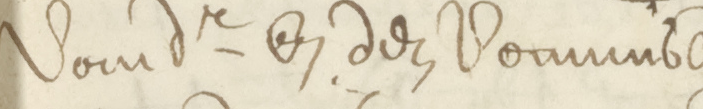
Comdr. & den Commis
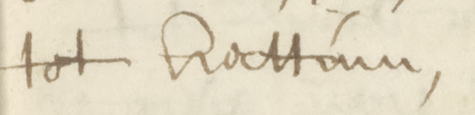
tot Hattum,
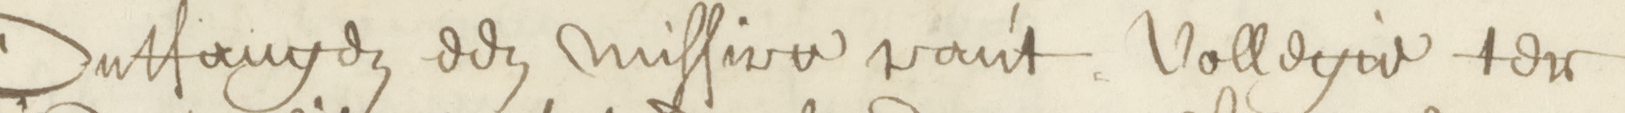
Ontfangen een missive van‛t Collegie ter
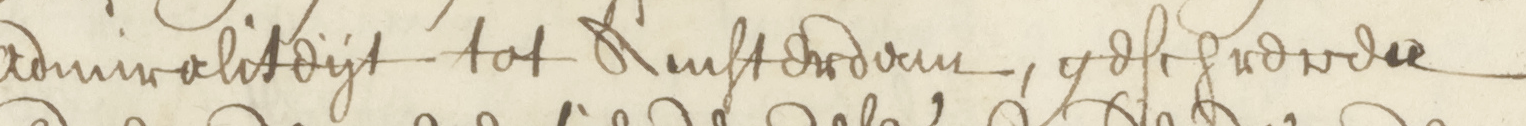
Admiraliteijt tot Amsterdam, geschreven
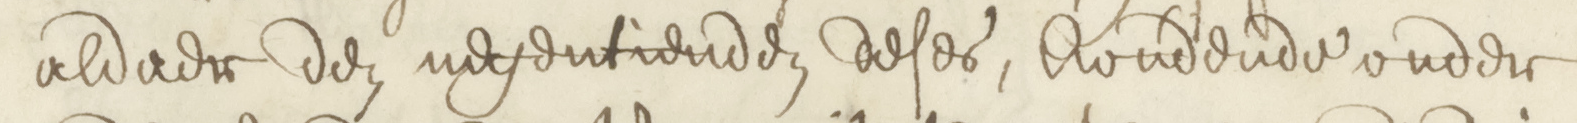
aldaer den negentienden deses, houdende onder
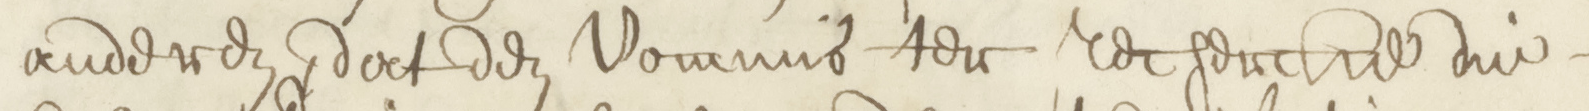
anderen, dat den Commis ter recherche die
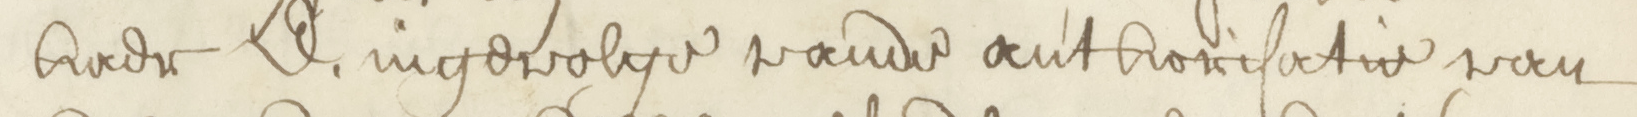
haer E. ingevolge vande authorisatie van
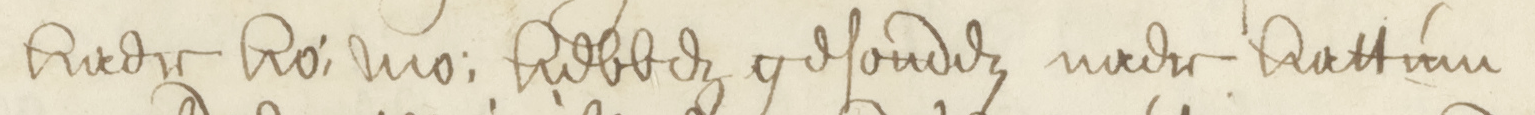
haer Ho:Mo: hebben gesonden naer Hattum
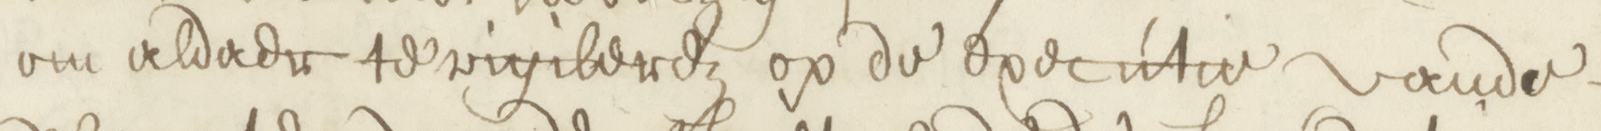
om aldaer te vigileren op de executie vande
